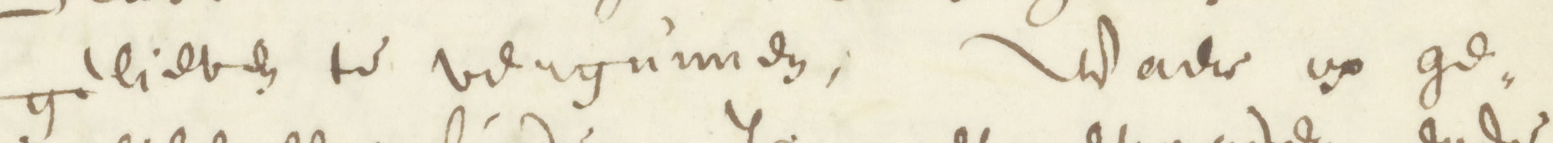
gelieven te vergunnen; Waer op ge„
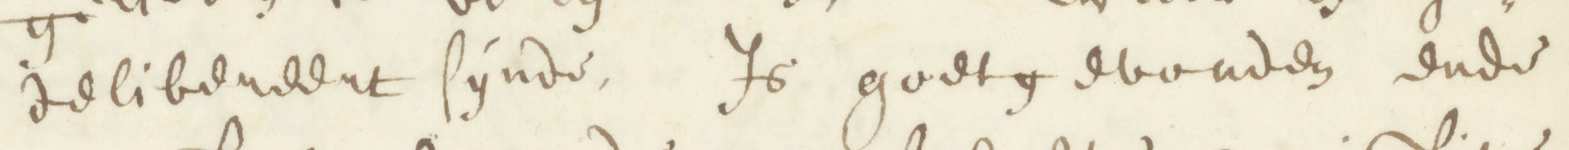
delibereert sijnde, Is goetgevonden ende
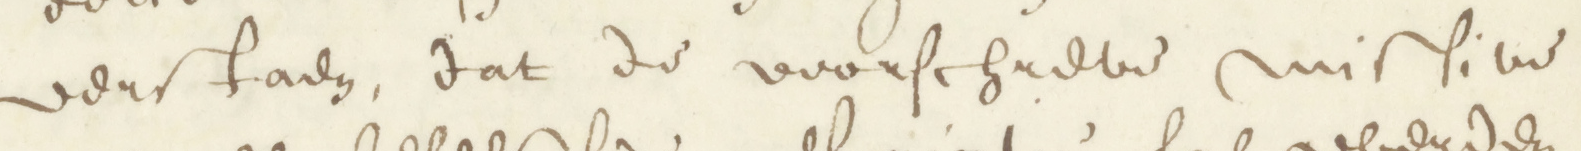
verstaen, dat de voorschreve missive
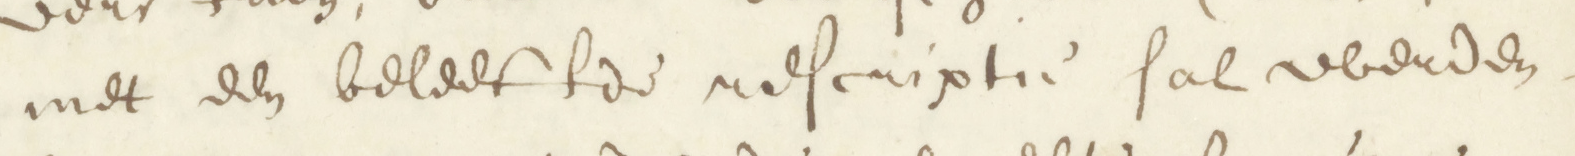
met een beleeffde rescriptie sal werden
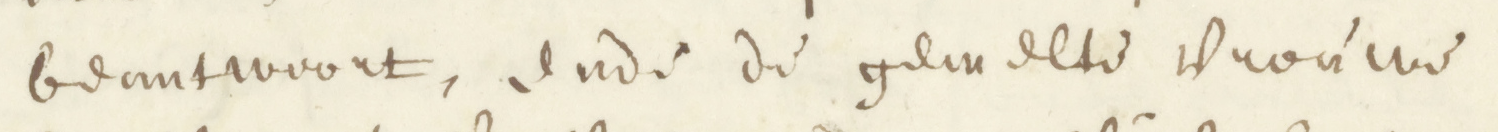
beantwoort, ende de gemelte Vrouwe
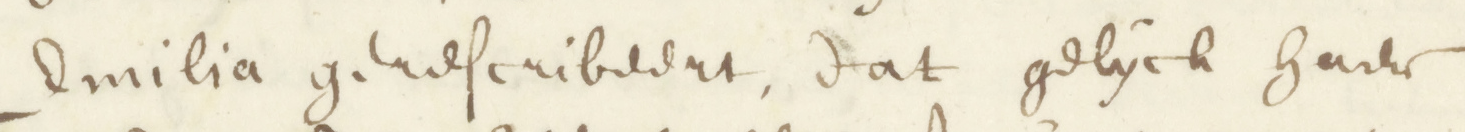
Emilia gerescribeert, dat gelijck haer
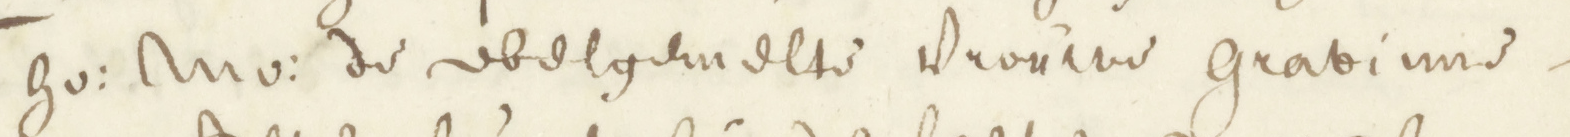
ho:mo: de welgemelte Vrouwe Gravinne
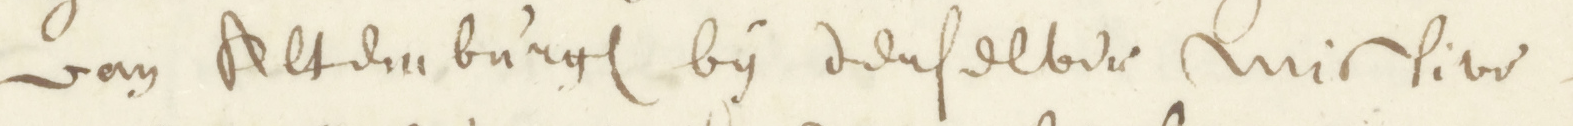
van Altenburgh bij derselver missive
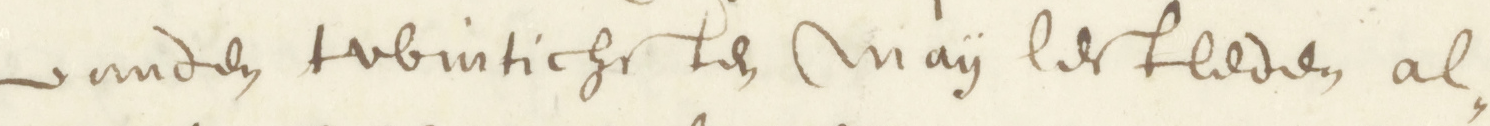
vanden twintichsten maij lestleden al
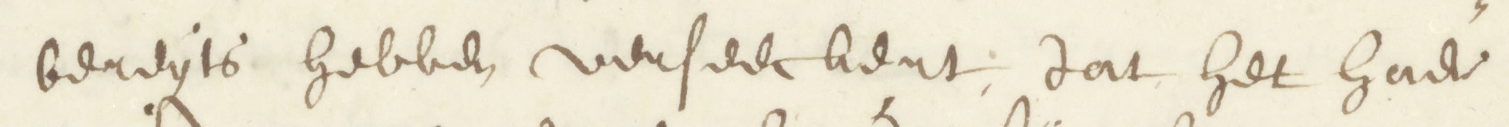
bereijts hebben verseeckert, dat het haer
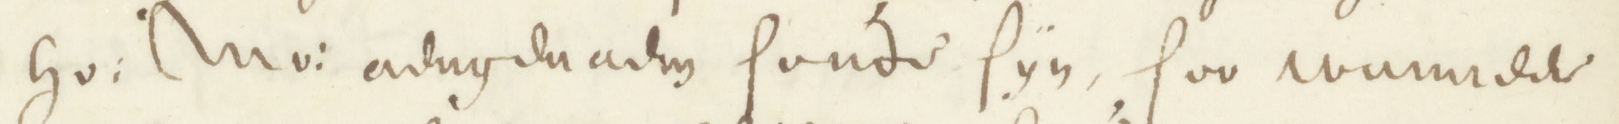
ho:mo: aengenaem soude sijn, soo wanneer
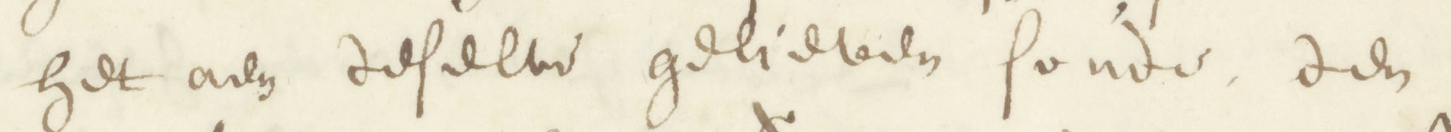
het aen deselve gelieven soude den
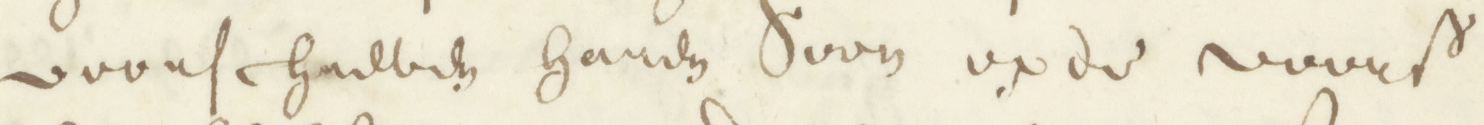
voorschreven haren Soon opde voors
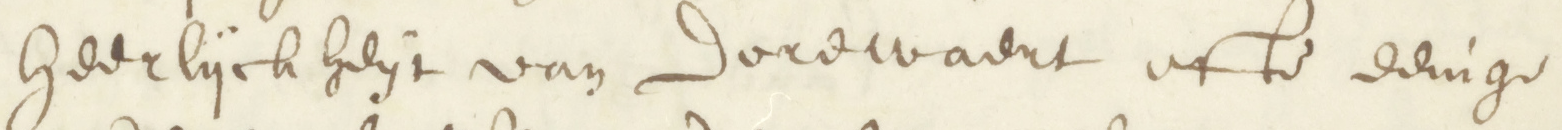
heerlijckheijt van Dorewaert ofte eenige
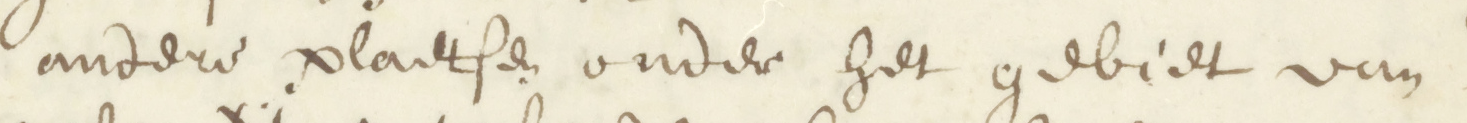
andere plaetsen onder het gebiet van
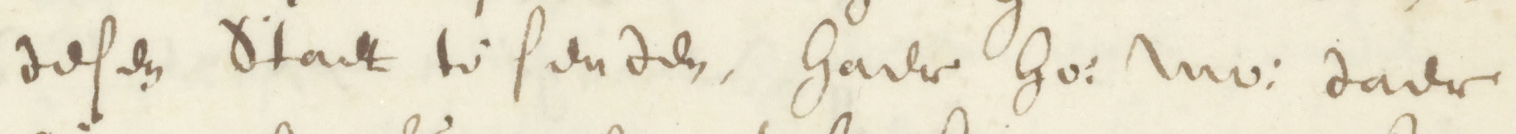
desen Staet te senden, haer ho:mo: daer
